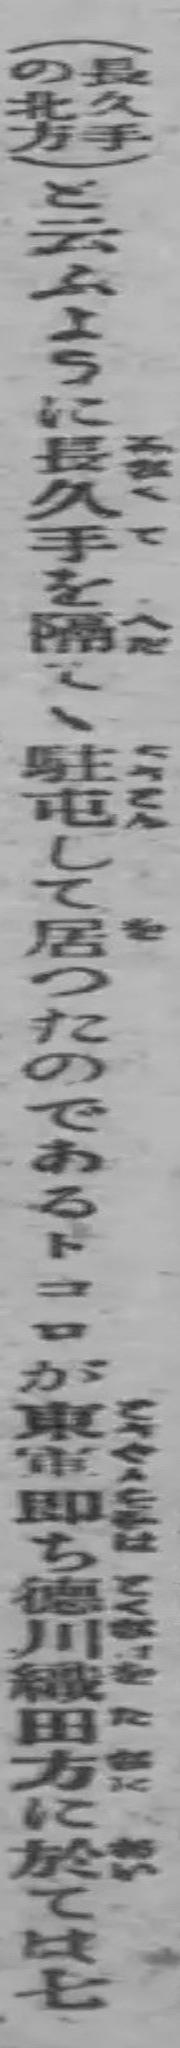(長久手の北方)と云ふように長久手を隔てゝ駐屯して居つたのであるトコロが東軍即ち徳川織田方に於ては七
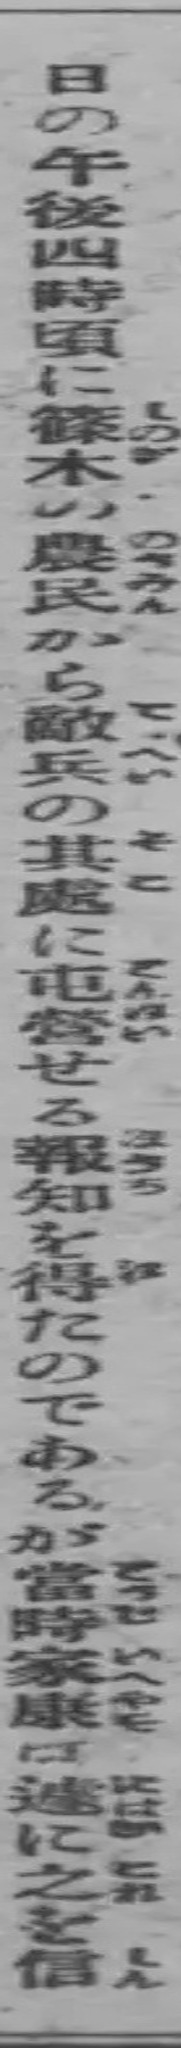日の午後四時頃に篠木の農民から敵兵の其処に屯営せる報知を得たのであるが当時家康は遽に之を信
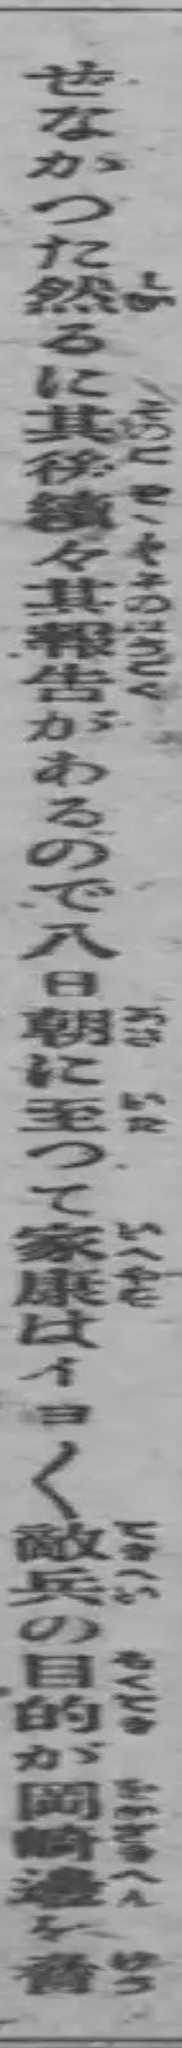ぜなかつた然るに其後続々其報告があるので八日朝に至つて家康はイヨ〳〵敵兵の目的が岡崎辺を脅
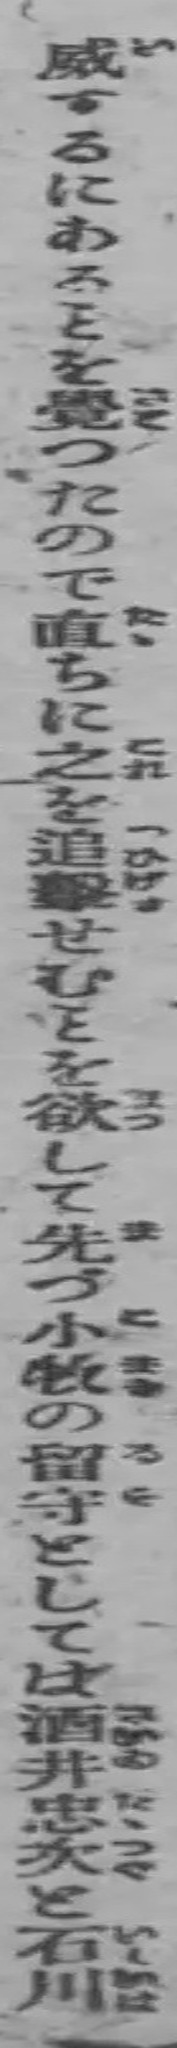家康の追撃威するにあることを覚つたので直ちに之を追撃せむことを欲して先づ小牧の留守としては酒井忠次と石川
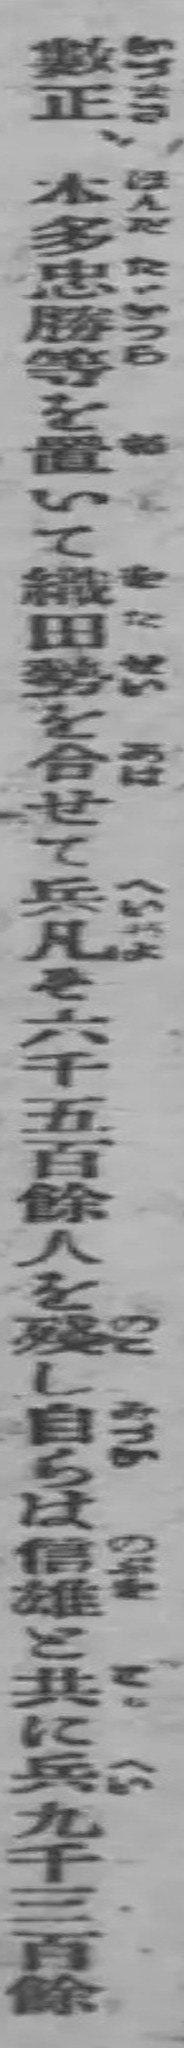数正、本多忠勝等を置いて織田勢を合せて兵凡そ六千五百余人を残し自らは信雄と共に兵九千三百余
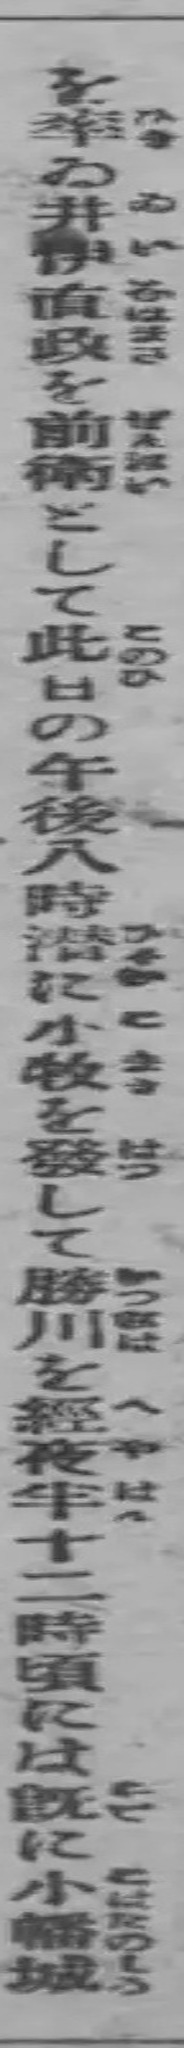を率ゐ井伊直正を前衛として此日の午後八時潜に小牧を発して勝川を経夜半十二時頃には既に小幡城
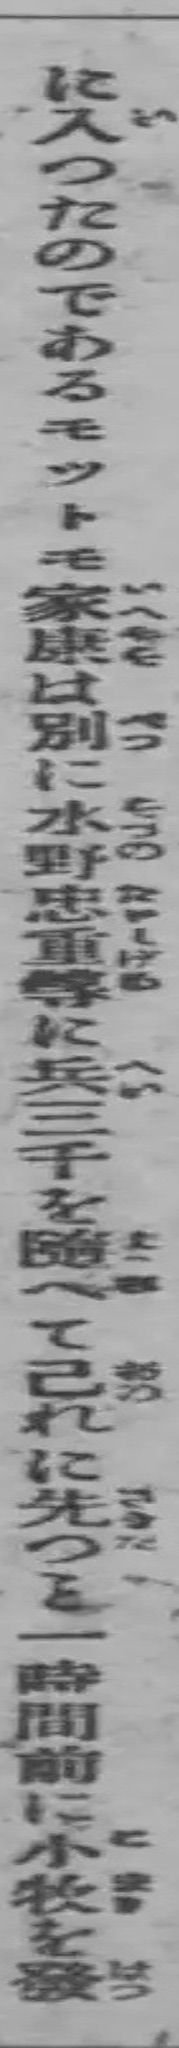水野支隊に入つたのであるモツトモ家康は別に水野忠重等に兵三千を随へて己れに先つこと一時間前に小牧を発
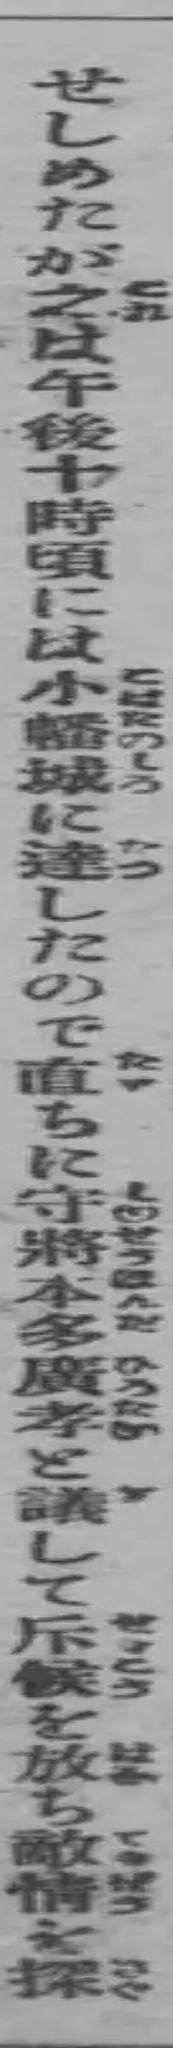せしめたが之は午後十時頃には小幡城に達したので直ちに守将本多広孝と議して斥候を放ち敵情を探
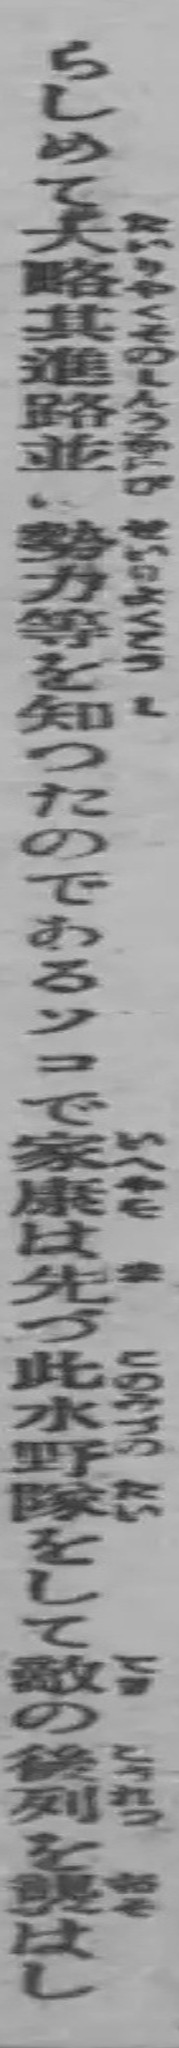らしめて大略其進路並に勢力等を知つたのであるソコで家康は先づ此水野隊をして敵の後列を襲はし
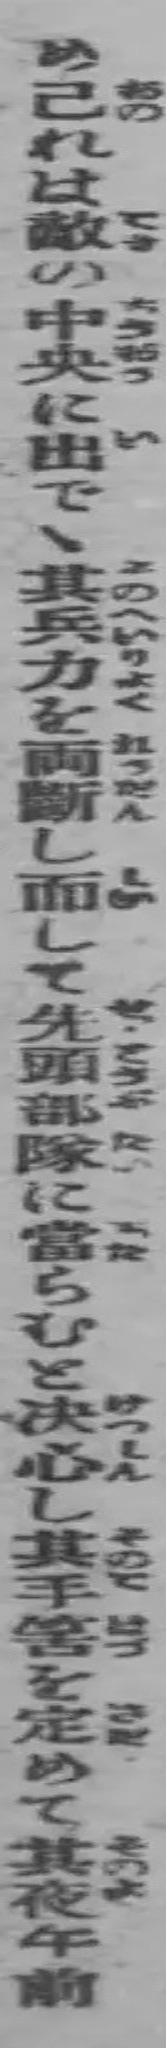め己れは敵の中央に出でゝ其兵力を両断し而して先頭部隊に当らむと決心し其手筈を定めて其夜午前
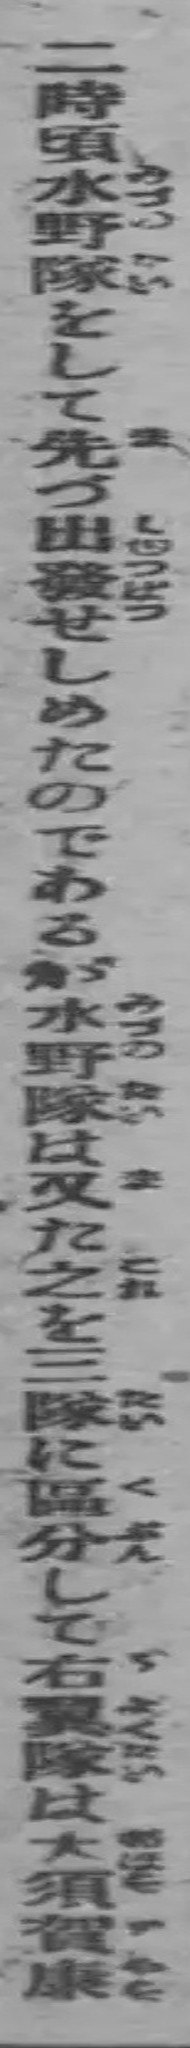二時頃水野隊をして先づ出発せじめたのであるが水野隊は又た之を三隊に区分して右翼隊は大須賀康

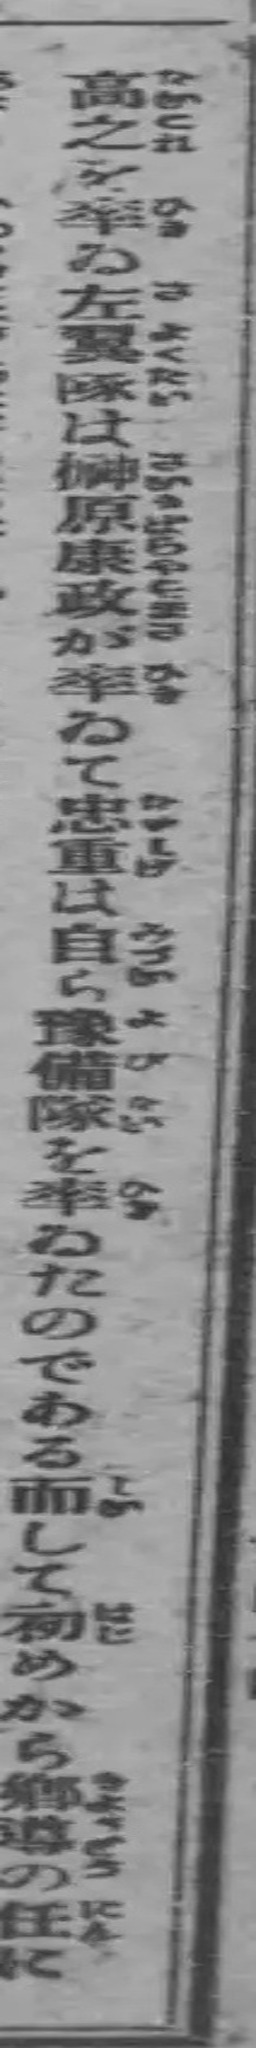高之を率ゐ左翼隊は榊原康政が率ゐて忠重は自ら予備隊を率ゐたのである而して初めから郷導の任に
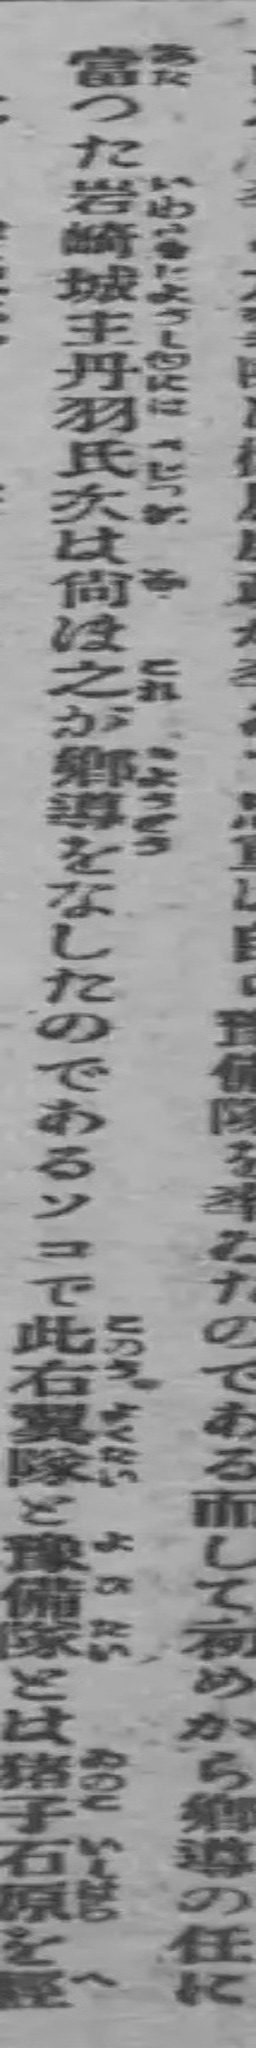白山林の戦当つた岩崎城主丹羽氏次は尚ほ之が郷導をなしたのであるソコで此右翼隊と予備隊とは猪子石原を経
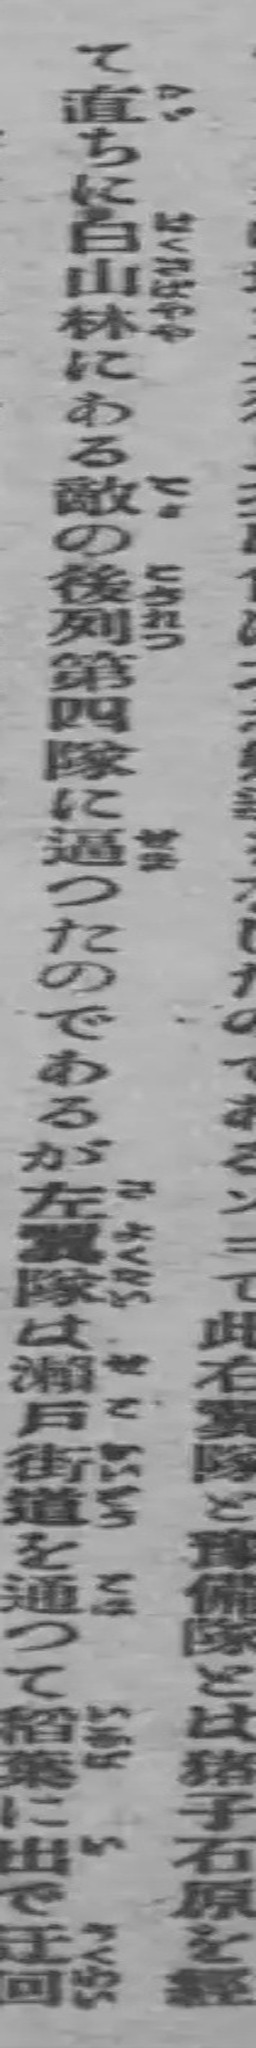て直ちに白山林にある敵の後列第四隊に逼つたのであるが左翼隊は瀬戸街道を通つて稲葉に出で迂回
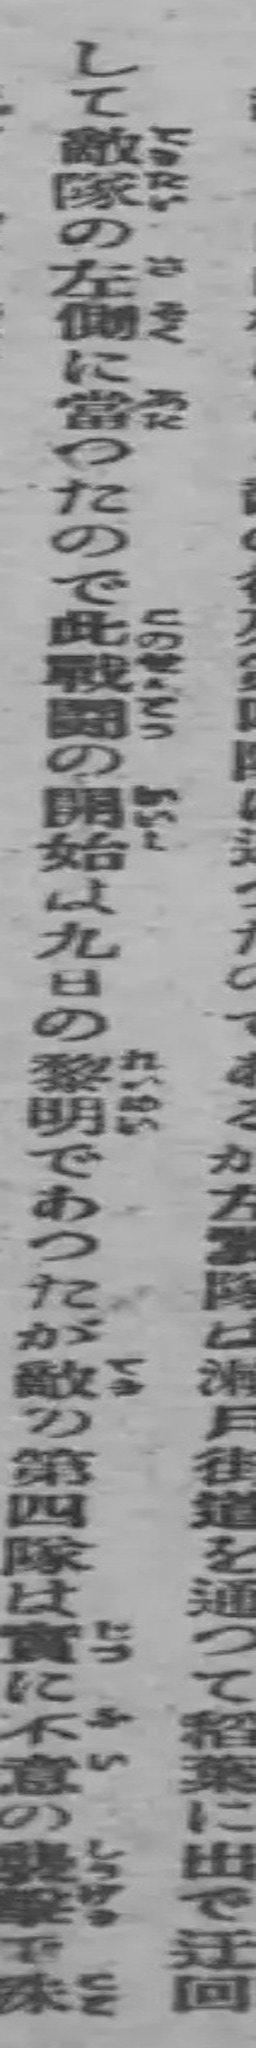して敵隊の左側に当つたので此戦闘の開始は九日の黎明であつたが敵の第四隊は実に不意の襲撃で殊
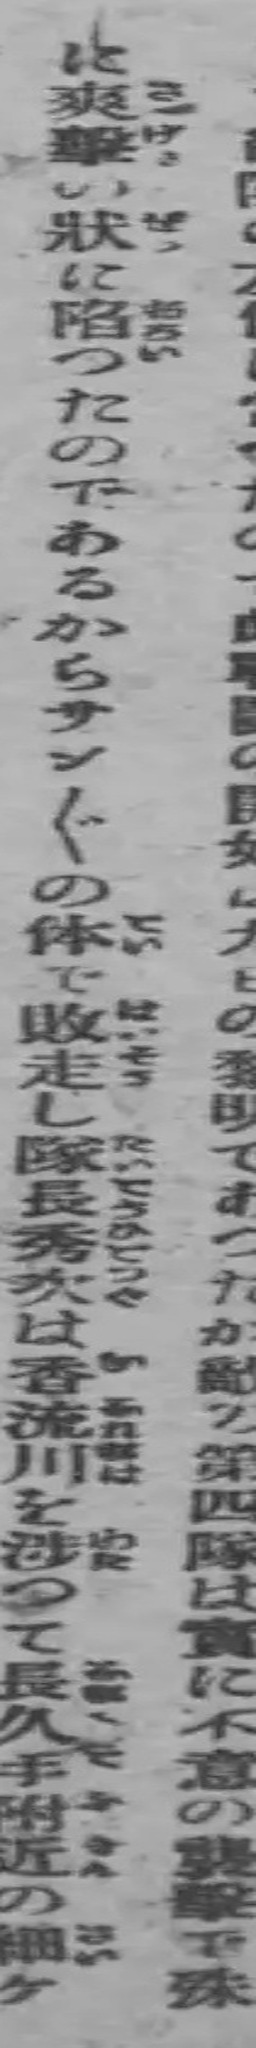細ケ根に夾撃の状に陥つたのであるからサン〴〵の体で敗走し隊長秀次は香流川を渉つて長久手附近の細ケ
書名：豊橋市史談
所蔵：国立国会図書館 National Diet Library, JAPAN
